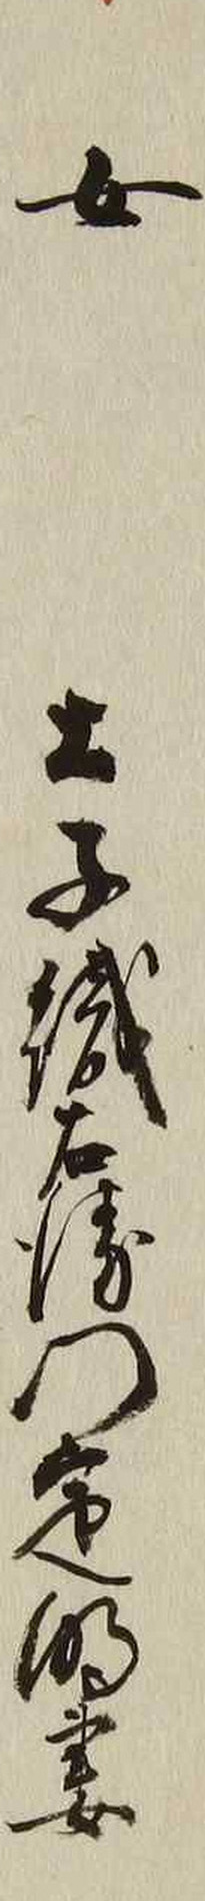女土子織右衛門定明妻
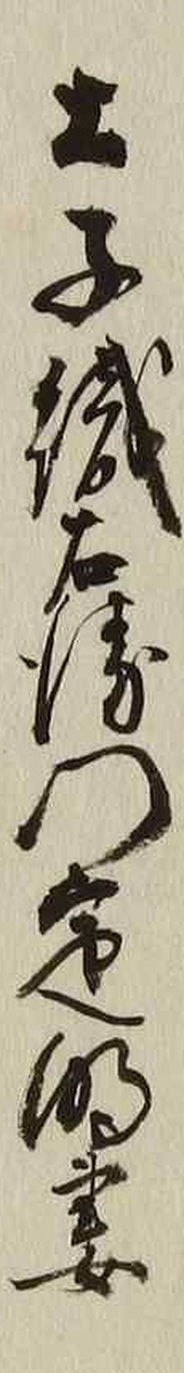女土子織右衛門定明妻
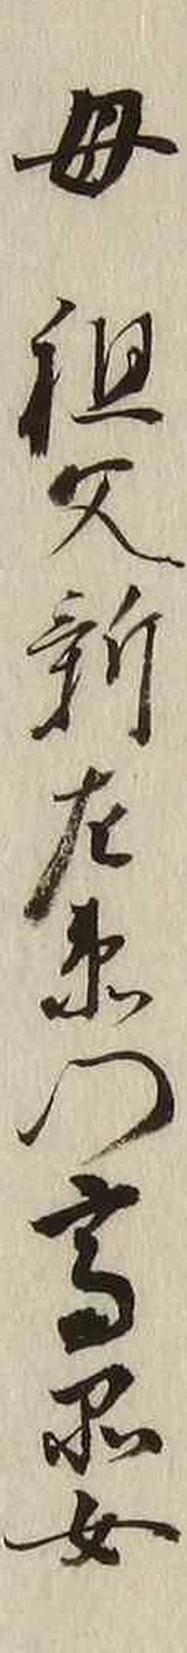母祖父新左衛門高品女
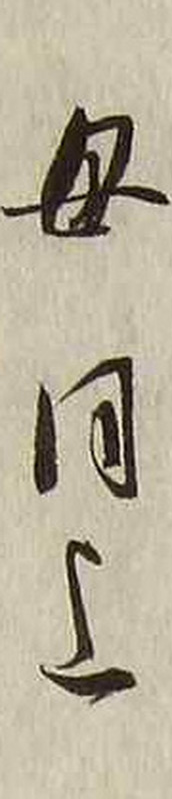母同上
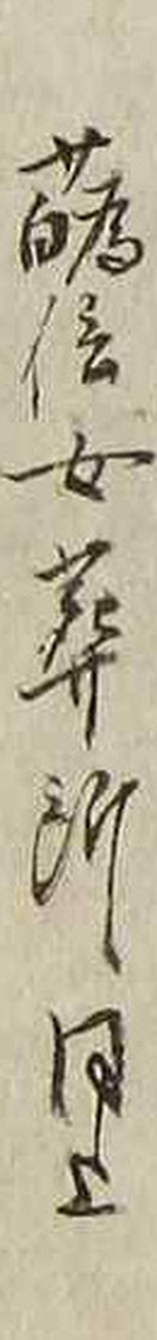信女葬所同上

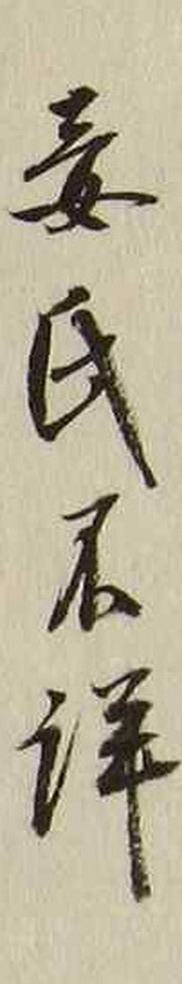妻氏不詳
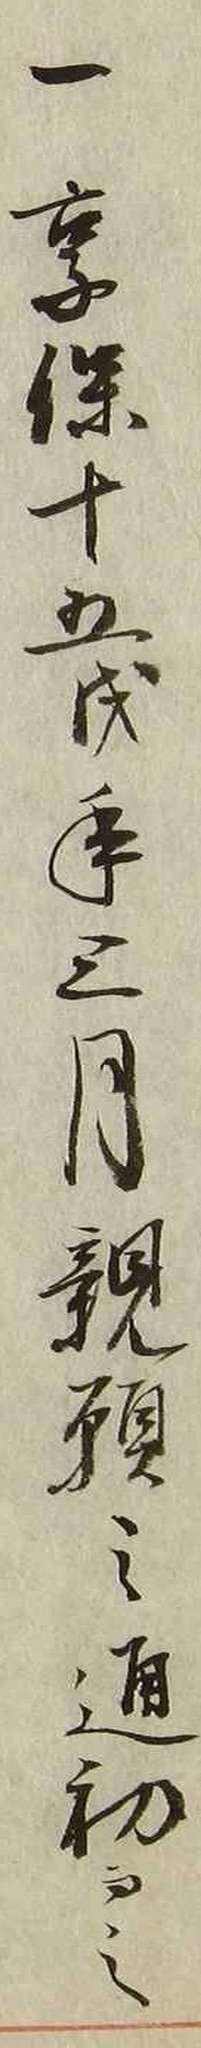一享保十五戊年三月親願之通初而之
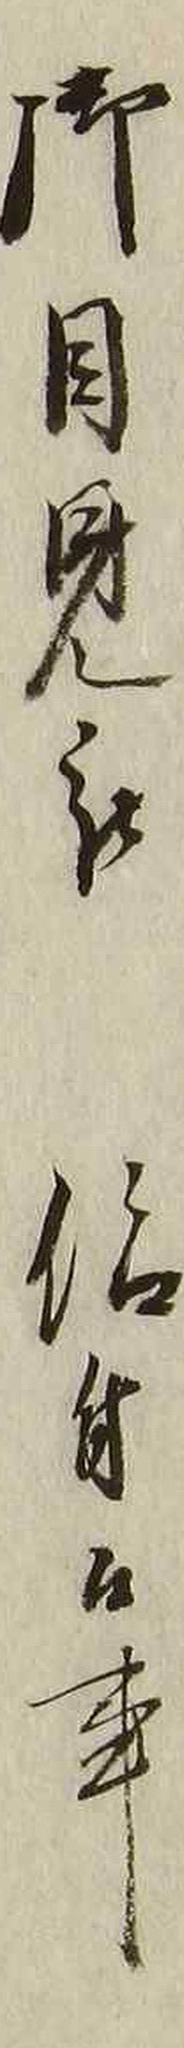御目見被仰付候事
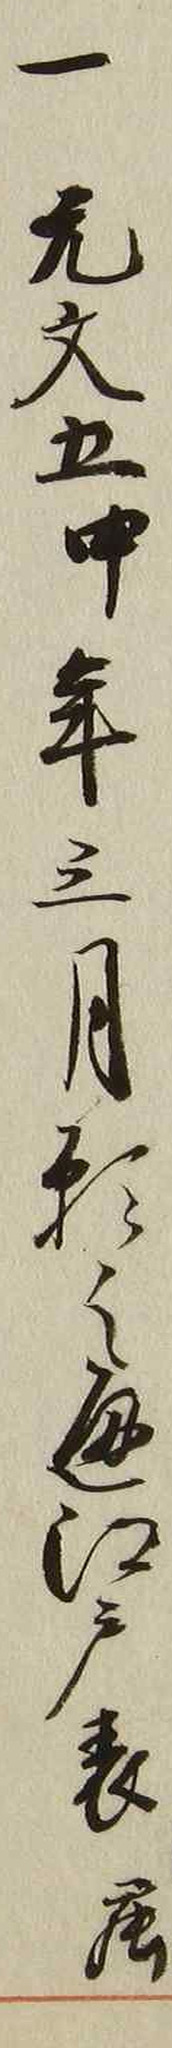一元文五申年三月願之通江戸表江罷
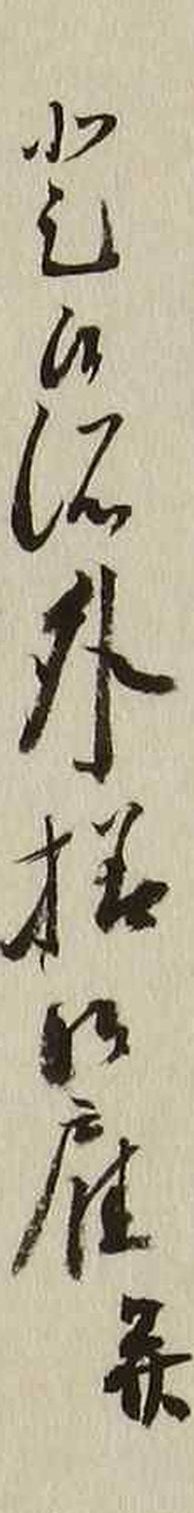登候所外様御雇并
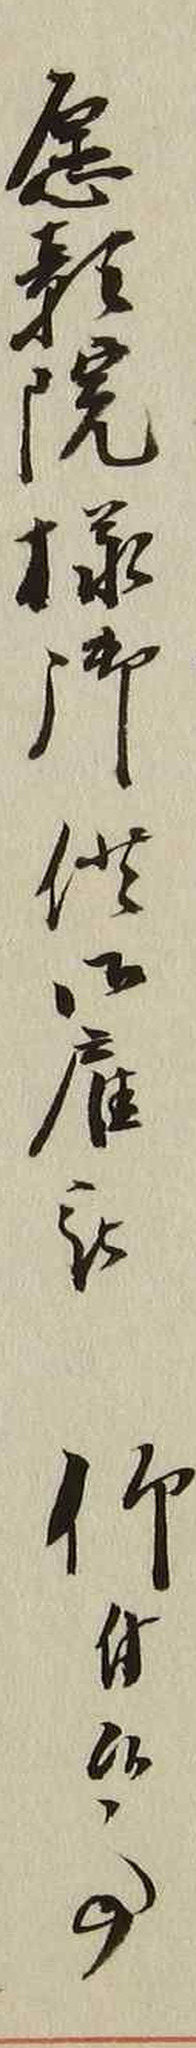愿影院様御供御雇被仰付候事
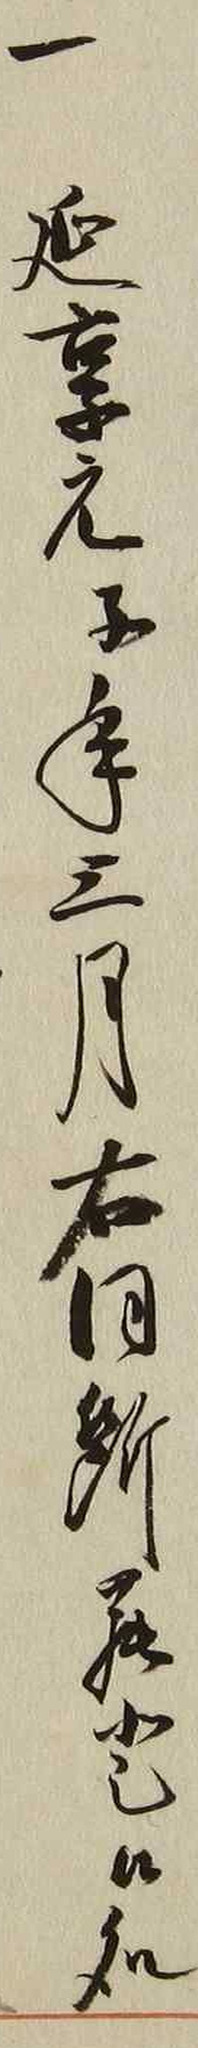一延享元子年三月右同断罷登候処
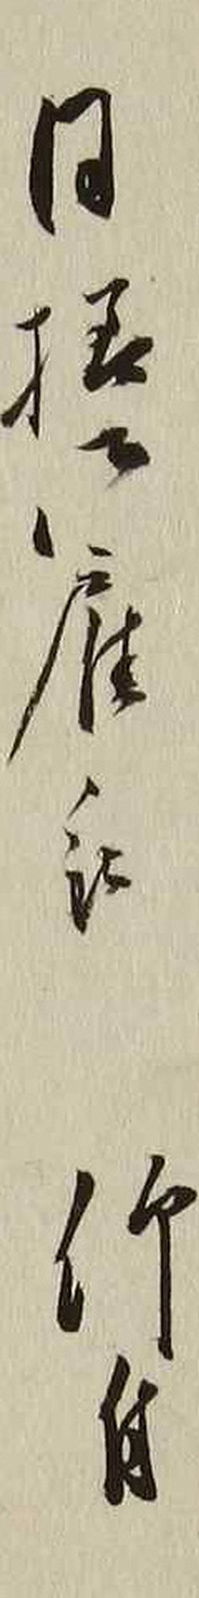同様御雇被仰付
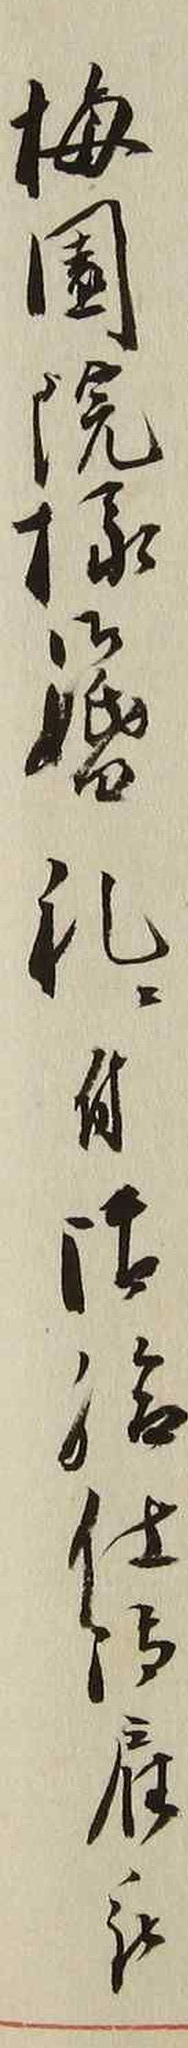梅園院様御婚礼ニ付御給仕御雇被
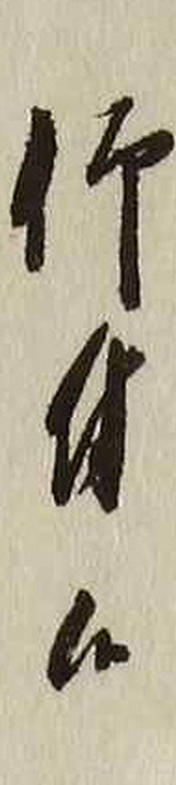仰付候
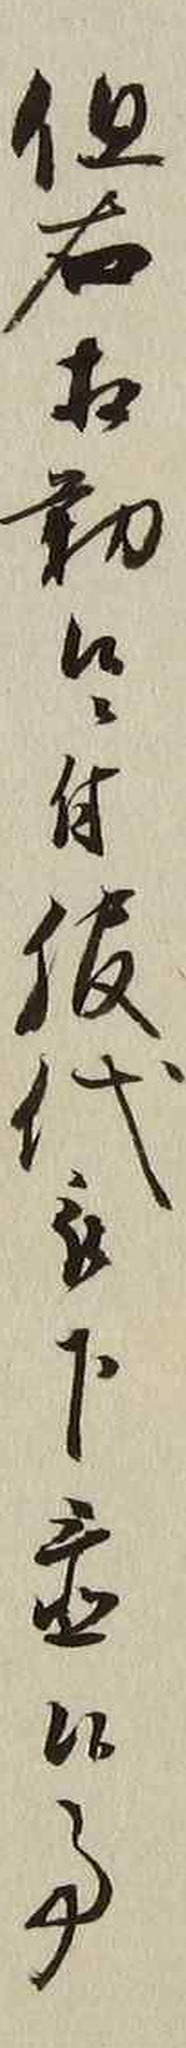但右相勤候ニ付服代被下置候事
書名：諸士系譜　巻之22　い之部22
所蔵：会津若松市立会津図書館
